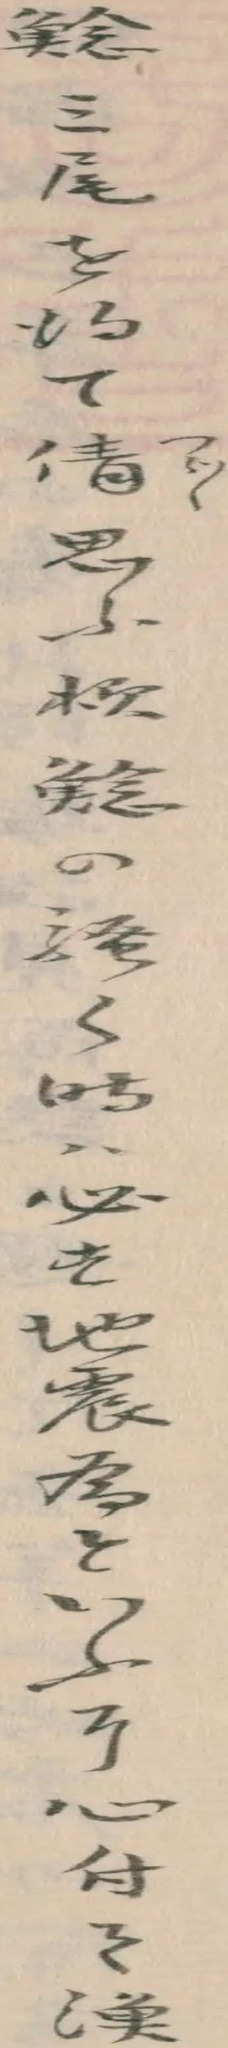鯰三尾を得て倩思ふ様鯰の騒く時は必す地震為といふに心付て漁
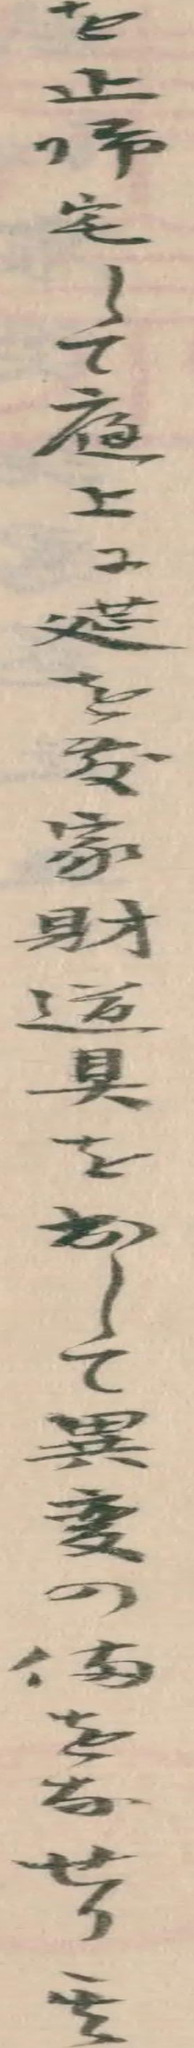を止帰宅して庭上に筵を敷家財道具を出して異変の備をなせり其
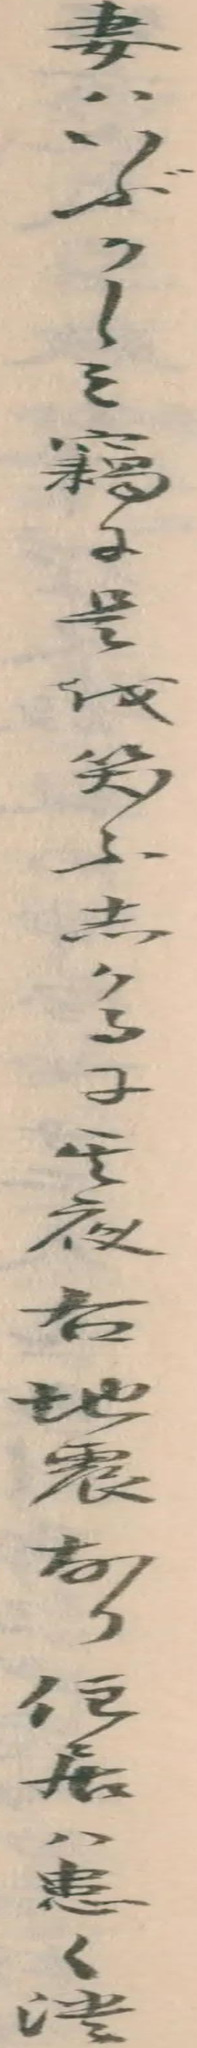妻はいぶかしみ竊に是を笑ふしかるに其夜右地震なり住居は悉く潰
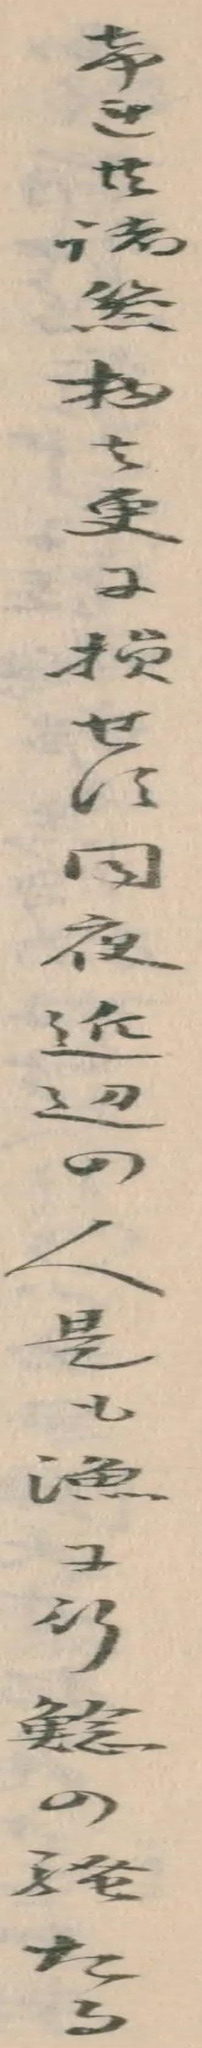けれ共諸器物は更に損せす同夜近辺の人是も漁に行鯰の騒たる
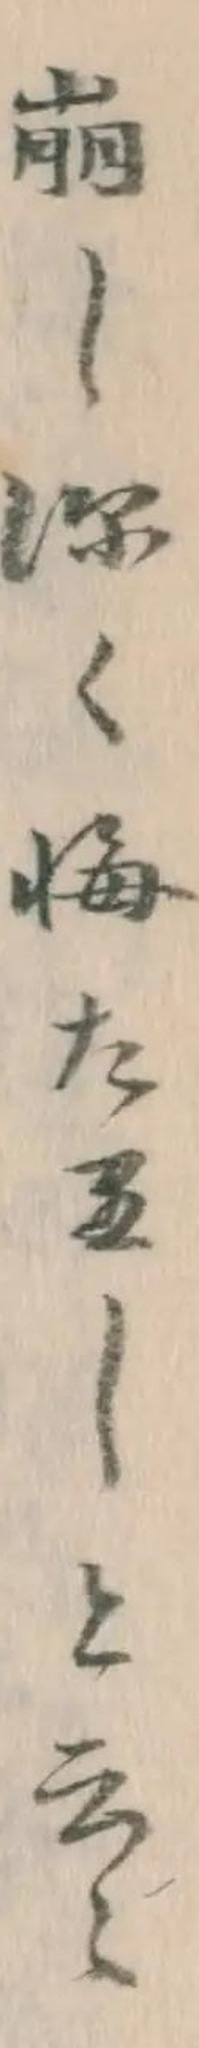崩し深く悔たりしと云々
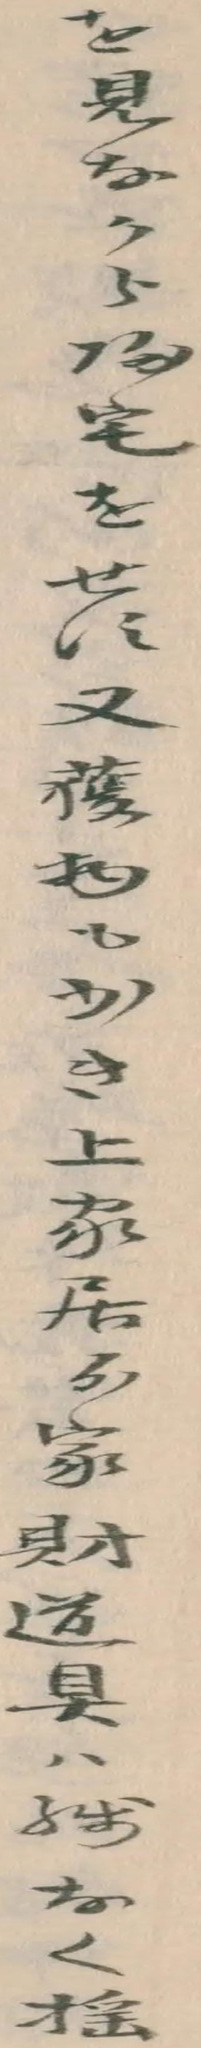を見なから帰宅をせす又獲物も少き上家居ゟ家財道具は残なく揺
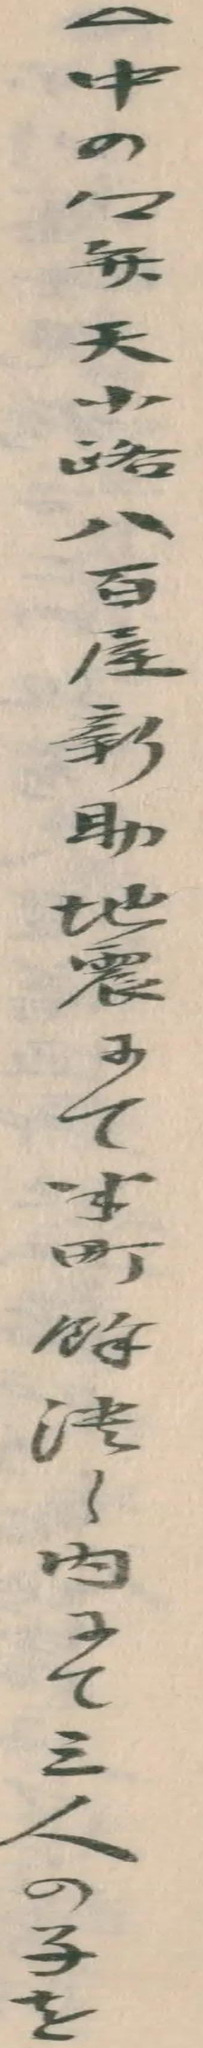△中の郷弁天小路八百屋新助地震にて半町余潰し内にて三人の子を
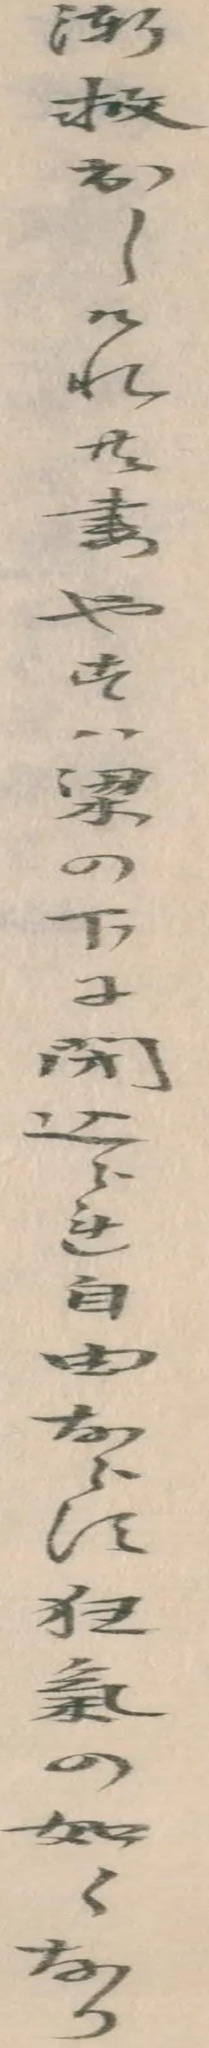漸救出しけれ共妻やすは梁の下に閉込られ自由ならす狂気の如くなり
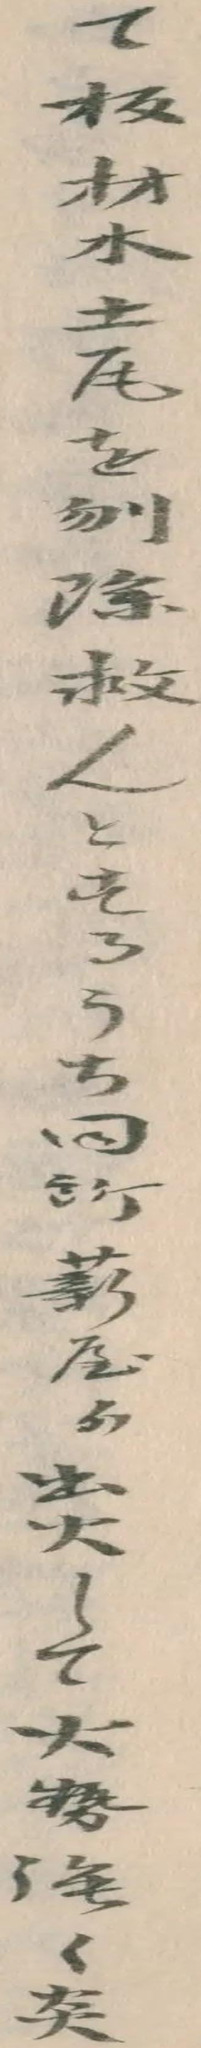て板材木土瓦を刎除救んとするうち同所薪屋ゟ出火して火勢強く炎
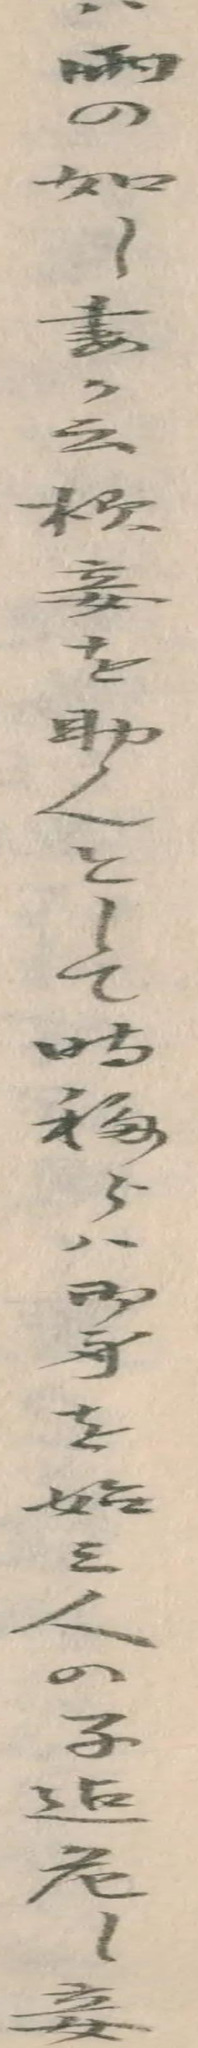は雨の如し妻か云様妾を助んとして時移らは御身を始三人の子迄危し妾
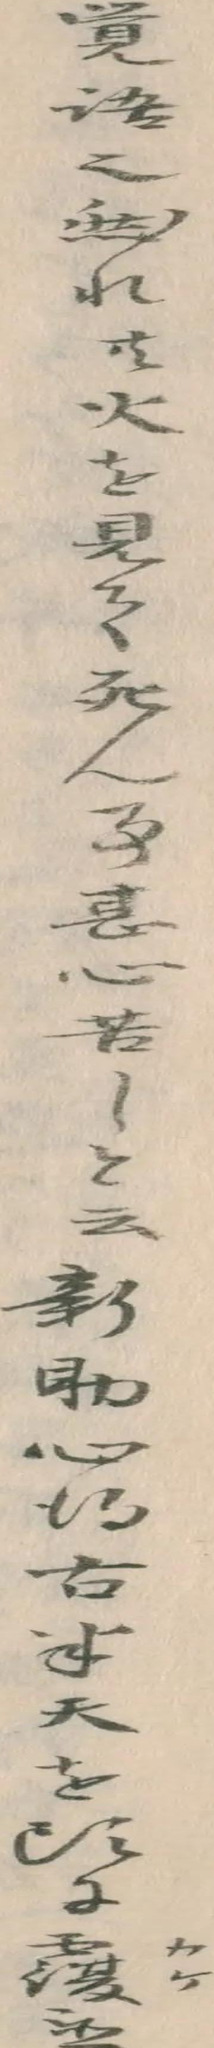覚悟也然れ共火を見て死ん事甚心苦しと云新助心得古半天を頭に覆置
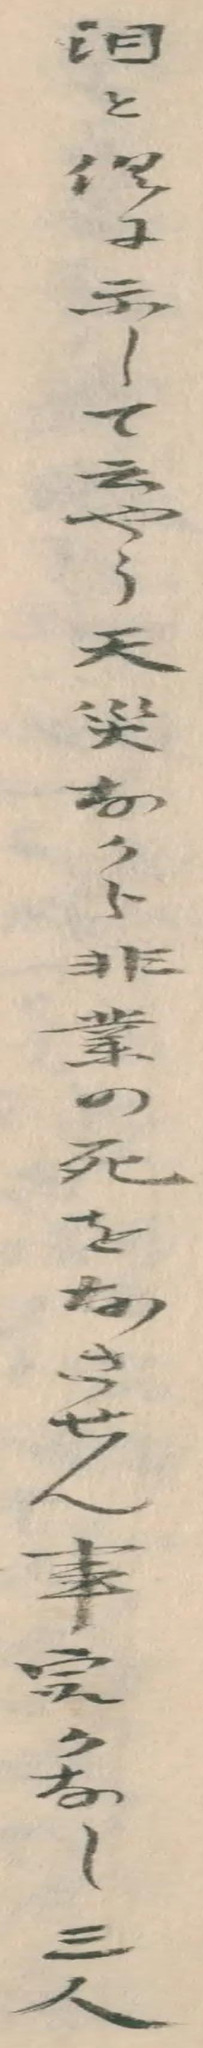泪と倶に示して云やう天災なから非業の死をなさせん事最かなし三人

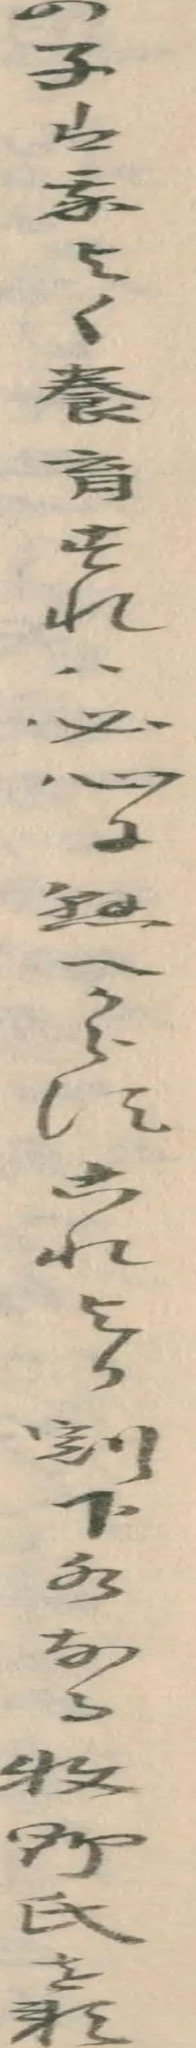の子は我よく養育すれは必心に懸へからすこれより割下水なる牧野氏を頼
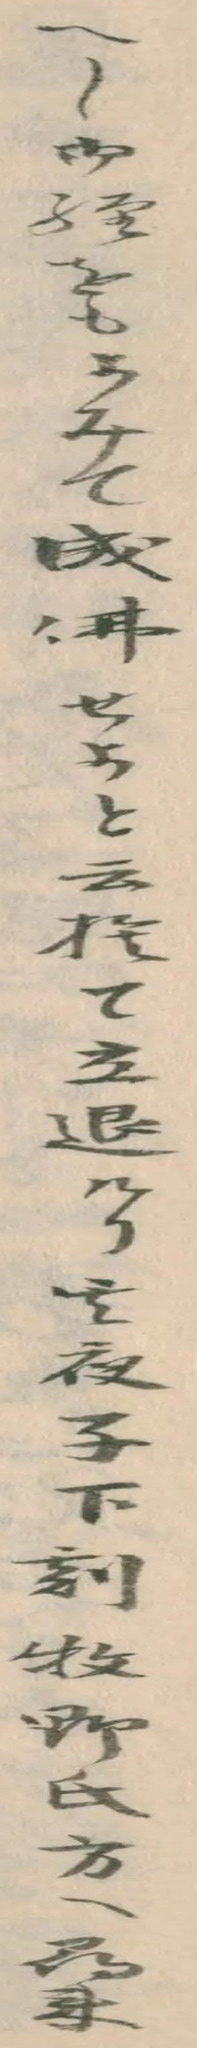へし御経をもよみて成仏せよと云捨て立退けり其夜子下刻牧野氏方へ尋来
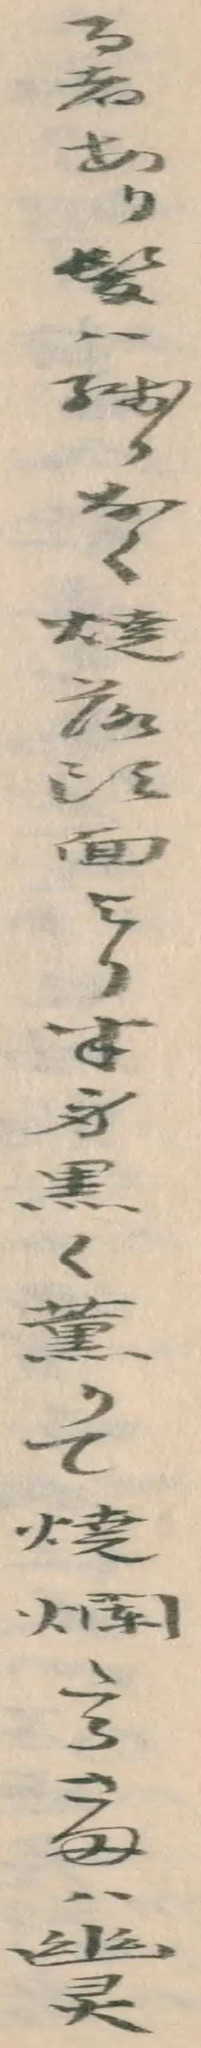る者あり髪は残りなく焼落頭面より半身黒く薫りて焼爛たるさまは幽霊
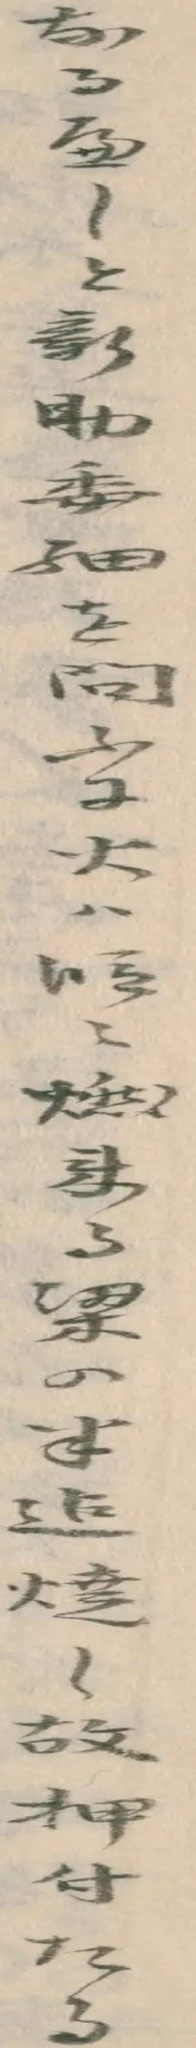なるへしと新助委細を問ふに火は段々燃来る梁の半迄焼し故押付たる
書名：地災撮要. 巻10(地震之部) 上,下
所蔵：国立国会図書館 National Diet Library, JAPAN
